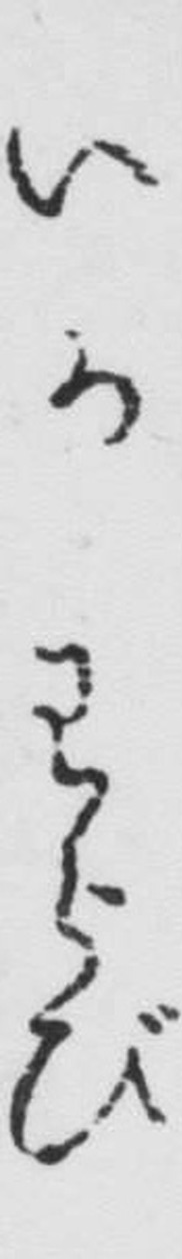いかわらび
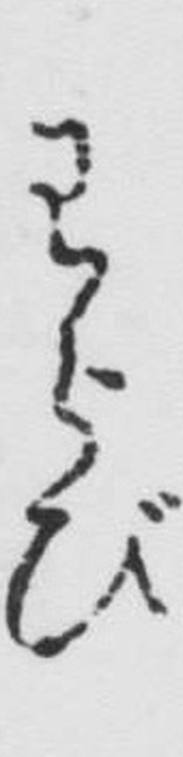わさび
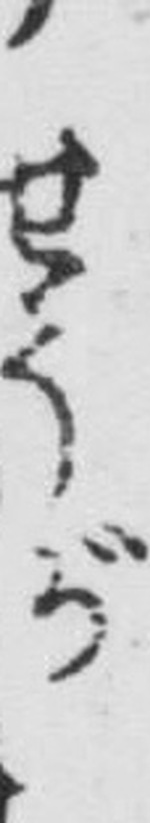せうが
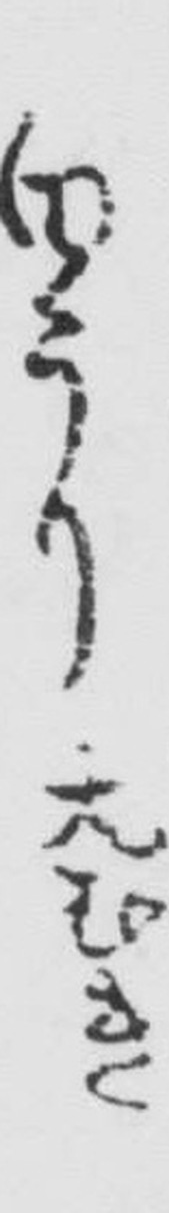白うり大むき
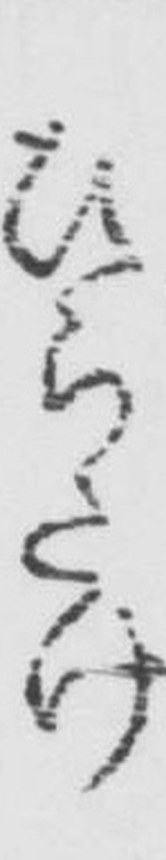ひらたけ
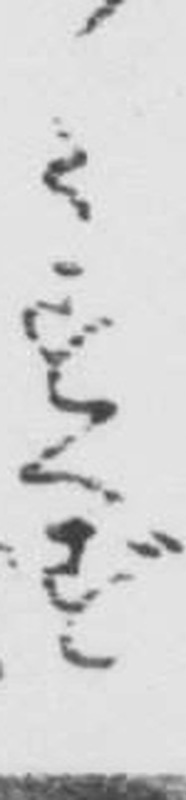うすくず
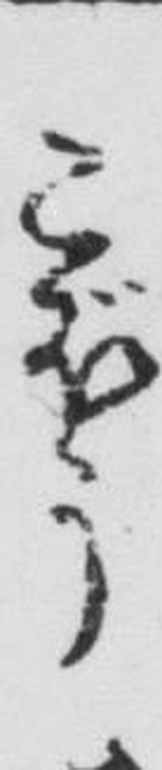こぼう
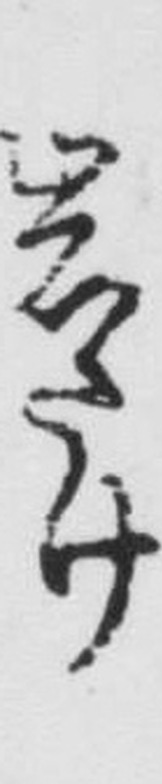岩たけ
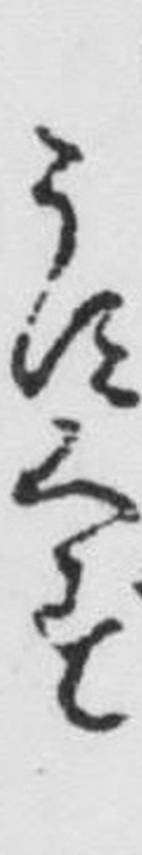うすくず
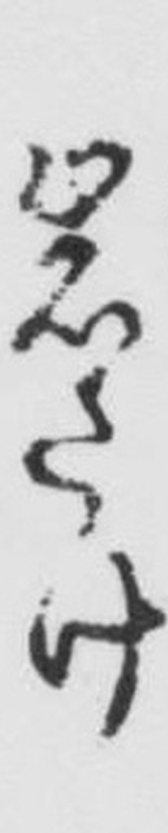岩たけ
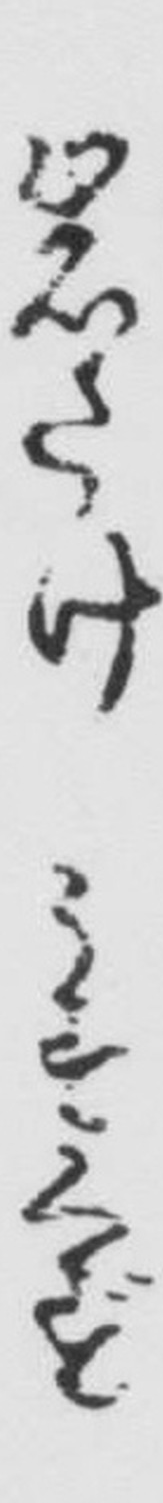岩たけうすくず
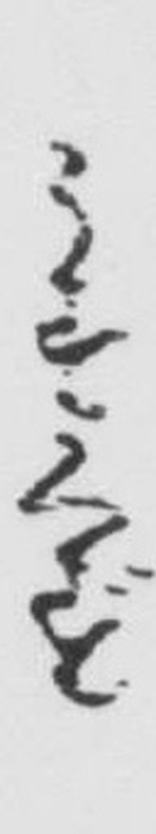うすくず
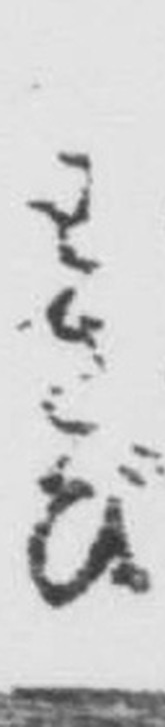わさび
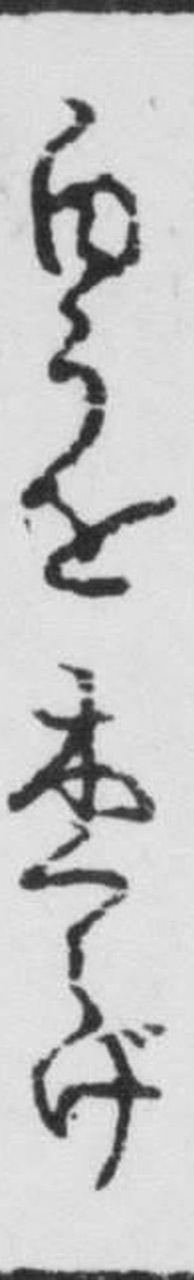白うを木くらげ
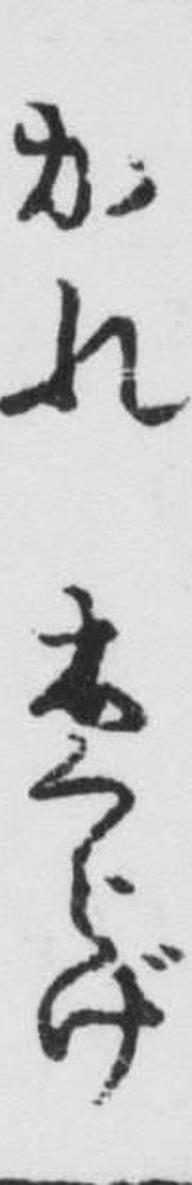かれ木くらげ
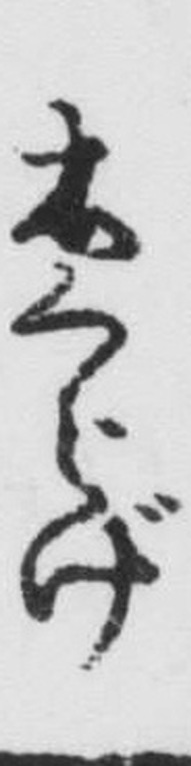木くらけ
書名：諸家通用/即席料理
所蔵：大阪府立大学学術情報センター 国文学研究資料館
